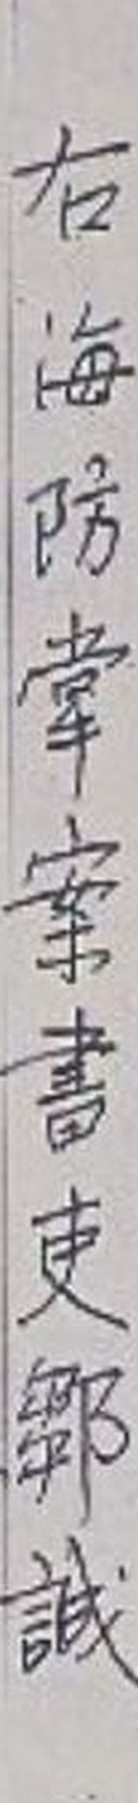右海防掌案書吏鄒誠
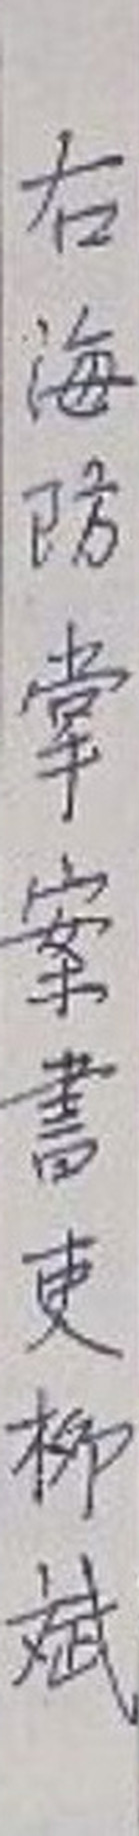右海防掌案書吏柳斌
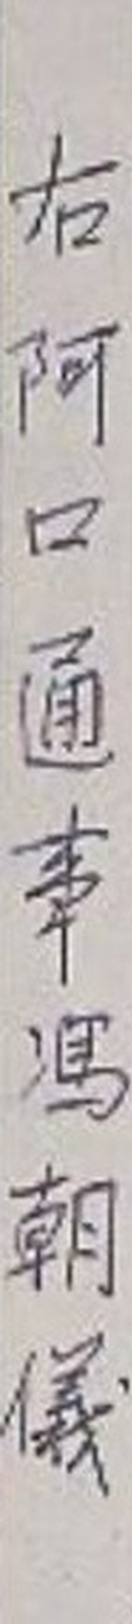右阿口通事馮朝儀
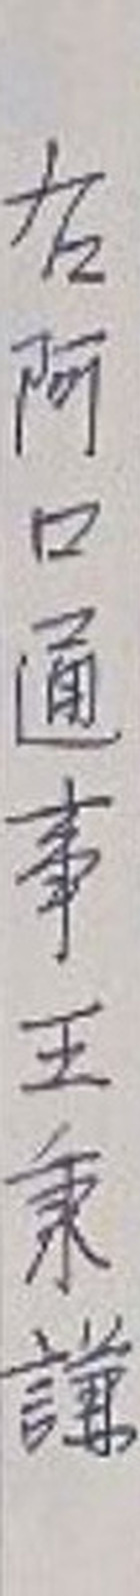右阿口通事王秉謙
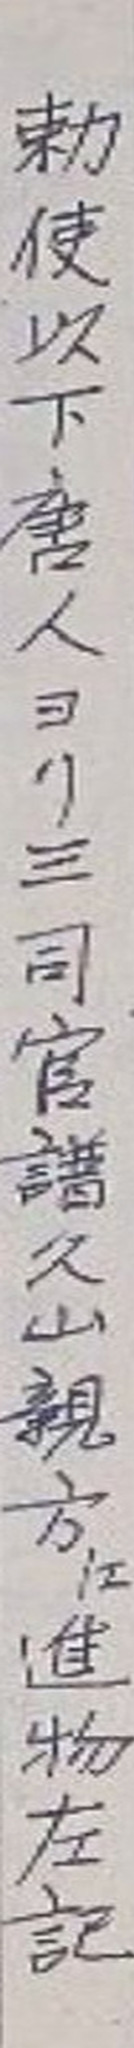勅使以下唐人より三司官譜久山親方え進物左記
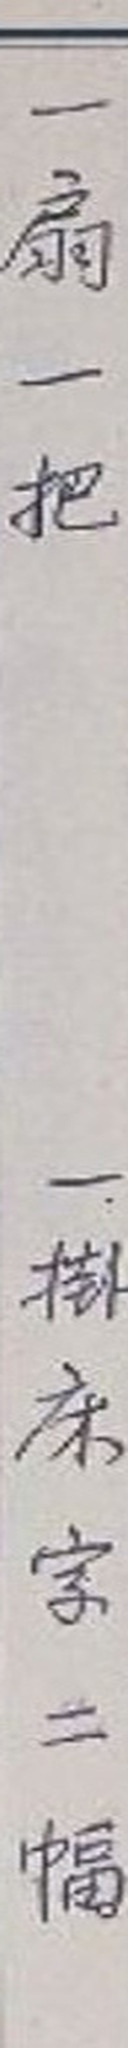一扇一把一掛床字二幅
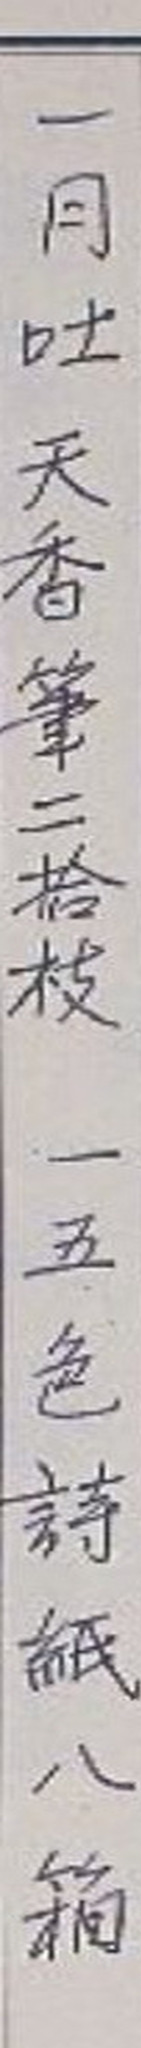一月吐天香筆二拾枝一五色詩紙八箱
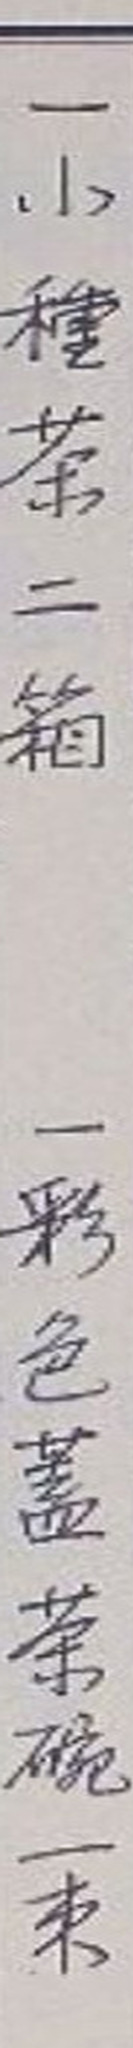一小種茶二箱一彩色蓋茶碗一束
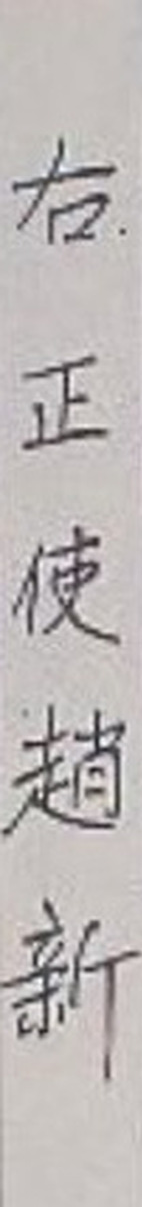右正使趙新
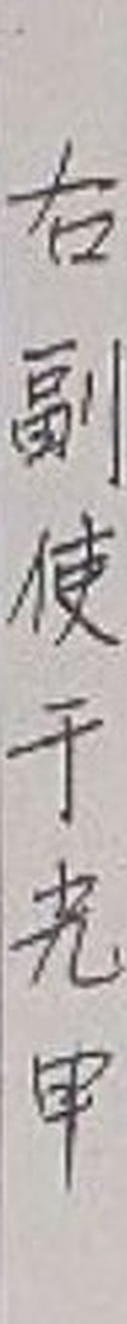右副使干光甲

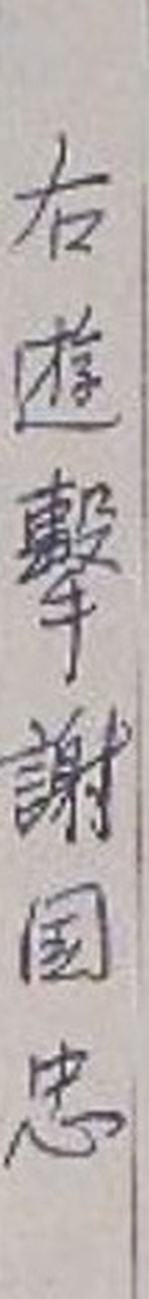右遊撃謝国忠
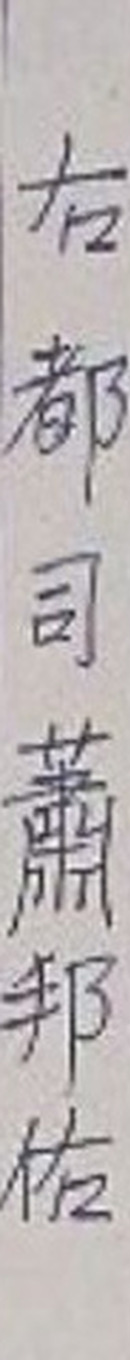右都司蕭邦佑
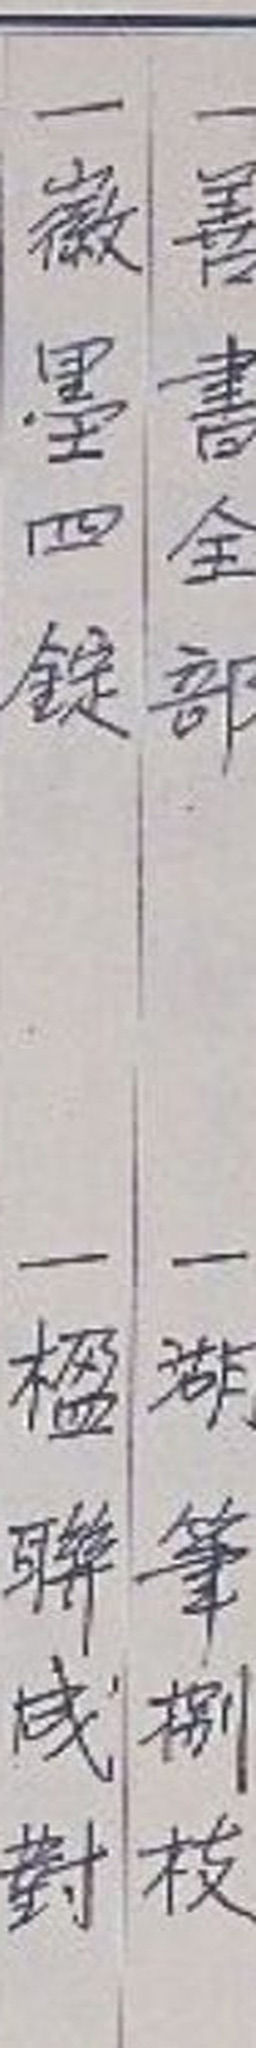一徽墨四錠一楹聯成対
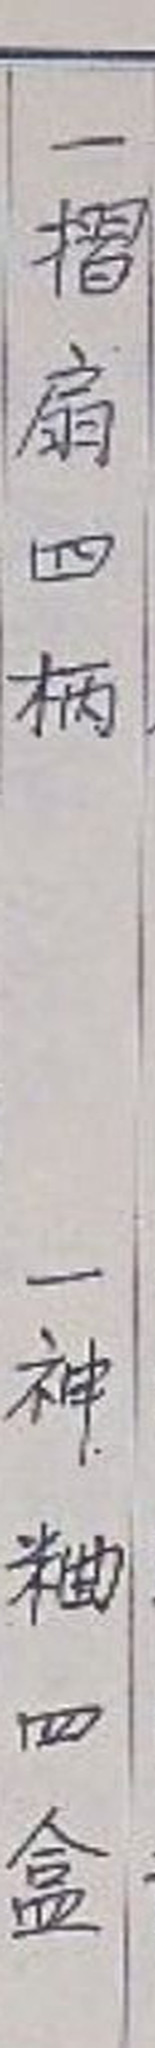一摺扇四柄一神粬四盒
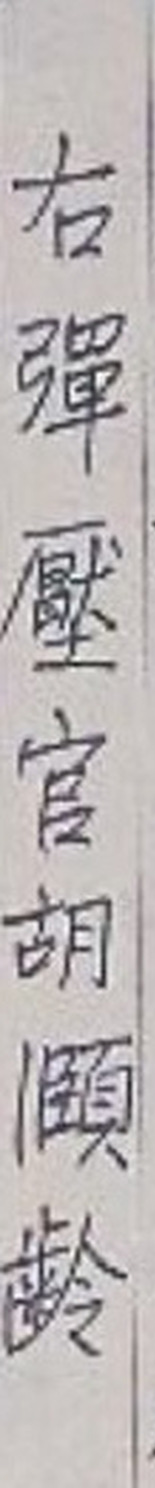右弾圧官胡頥齢
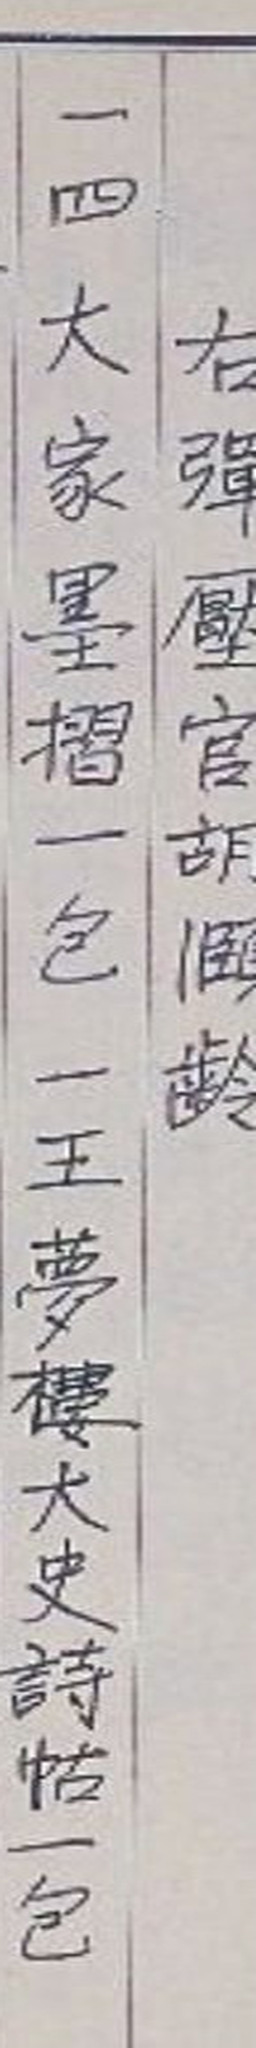一四大家墨摺一包一王夢楼大史詩帖一包
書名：支那冊封使来琉諸記 下巻
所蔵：University of the Ryukyus Library
